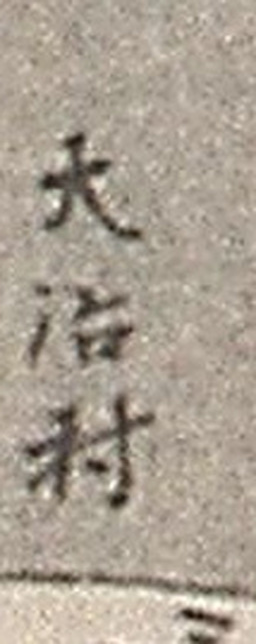大治村
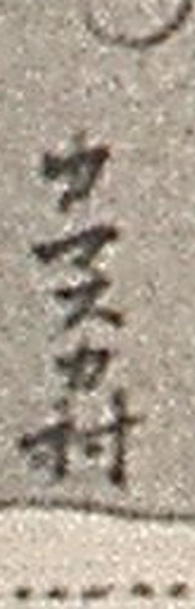カマスカ村
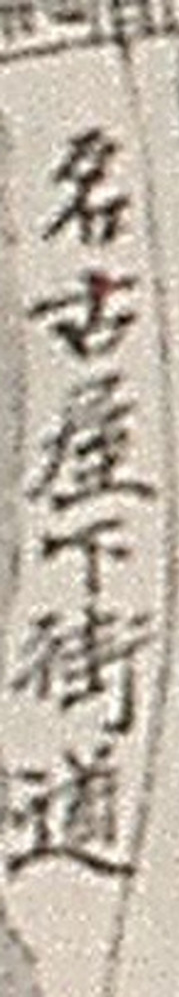名古屋下街道
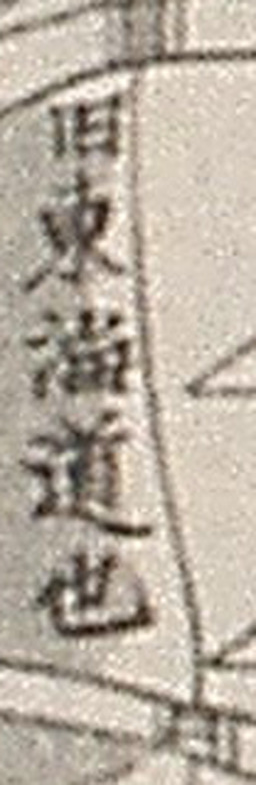旧東海道也
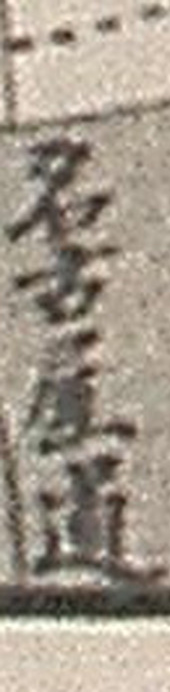名古屋道
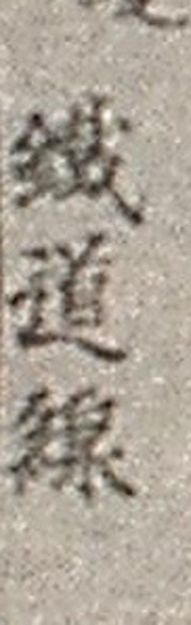鉄道線
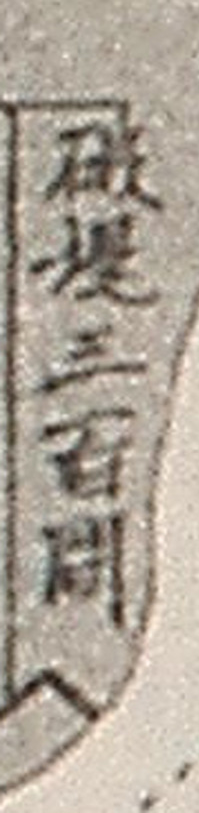破堤三百間
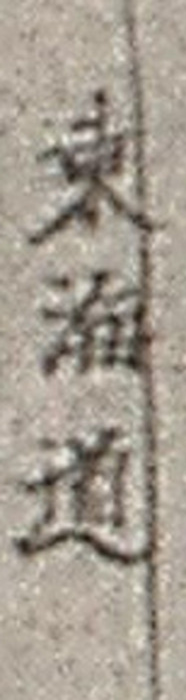東海道
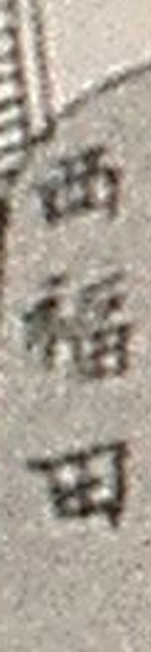西福田
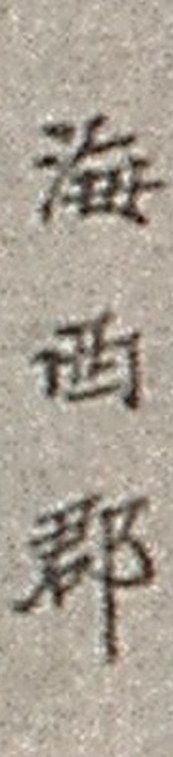海西郡

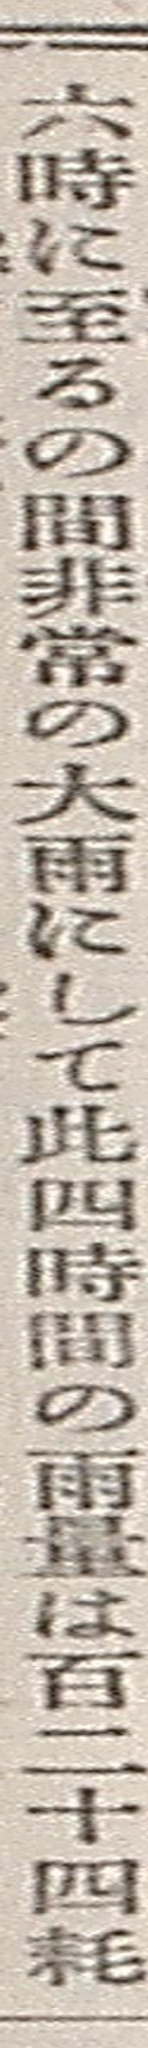六時に至るの間非常の大雨にして此四時間の雨量は百二十四粍
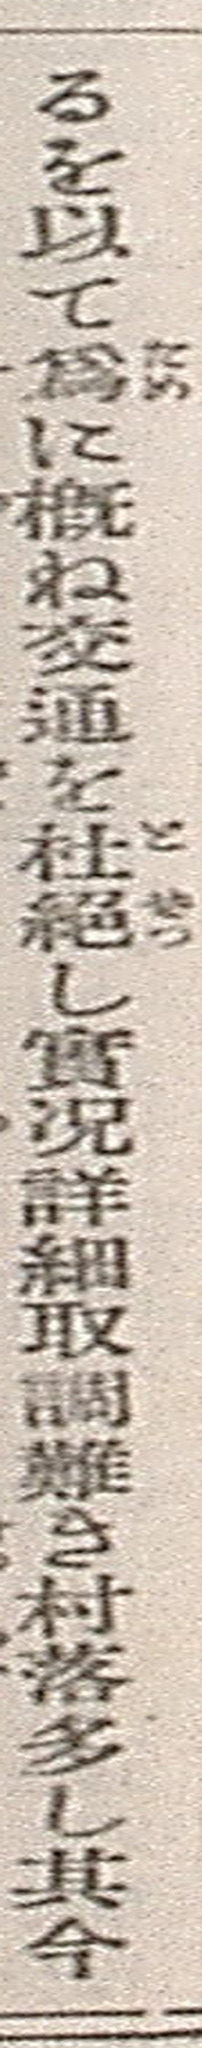なるを以て為に概ね交通を杜絶し実況詳細取調難き村落多し其今
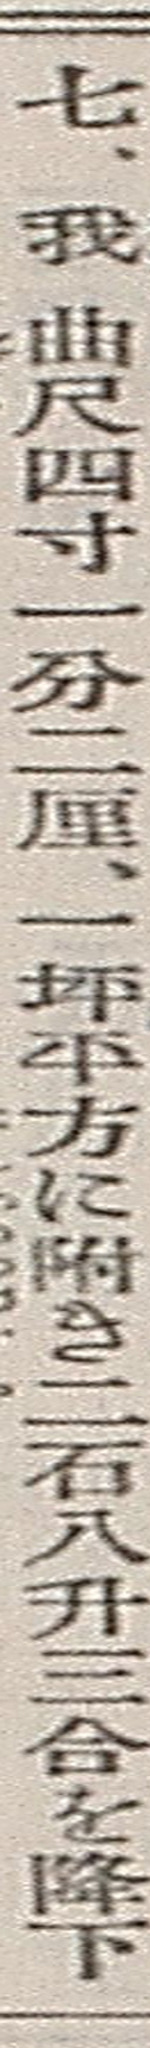七、我曲尺四寸一分二厘、一坪平方に附き二石八升三合を降下
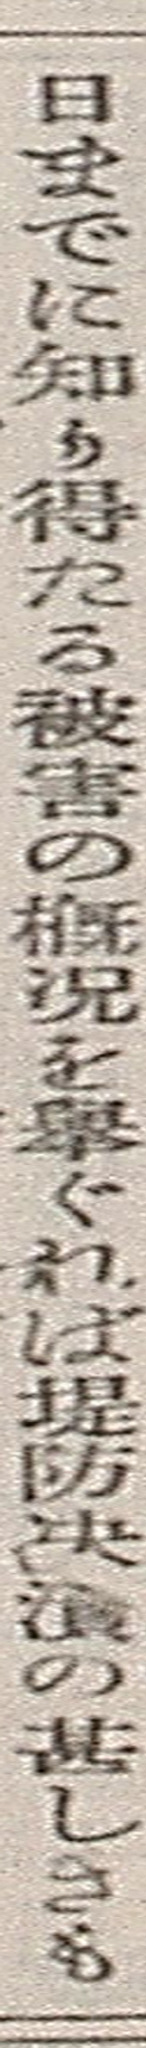日までに知り得たる被害の概況を挙ぐれば堤防决壊の甚しきも
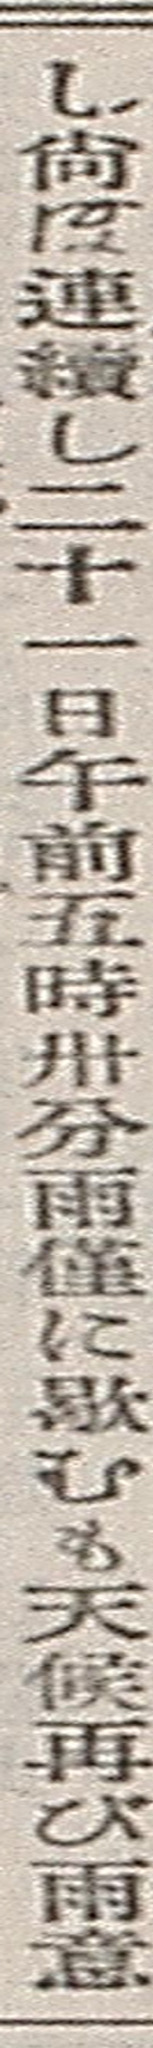し尚ほ連続し二十一日午前五時卅分雨僅に歇むも天候再び雨意
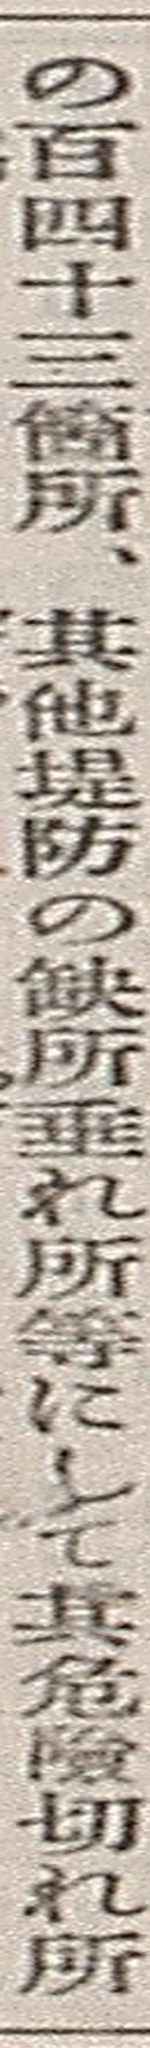の百四十三箇所、其他堤防の缺所垂れ所等にして其危険切れ所
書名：風俗畫報臨時増刊第百二十六號　洪水被害録（中）
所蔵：東京大学地震研究所図書室 Earthquake Research Institute Library, The University of Tokyo, JAPAN
